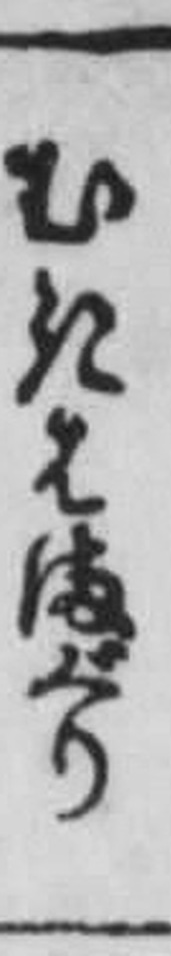むきはまぐり
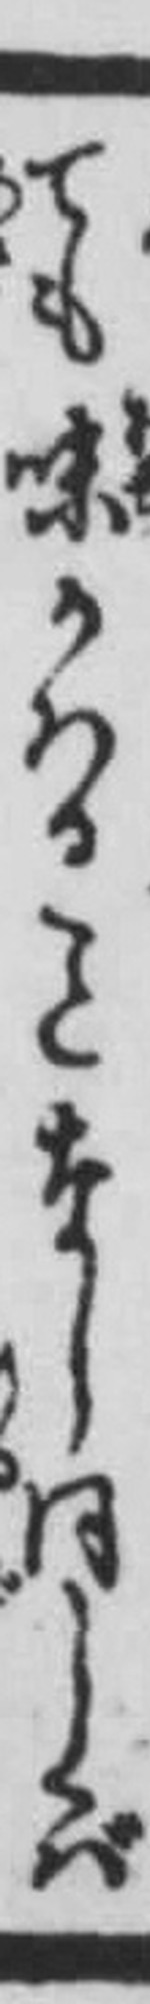ても味かわることなしほしくば
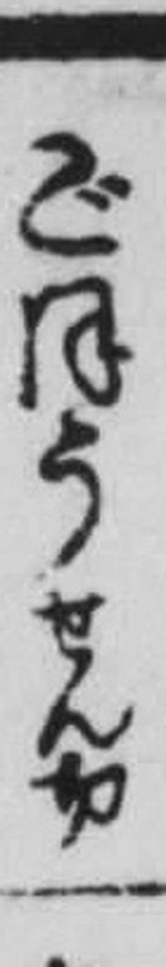ごほうせん切
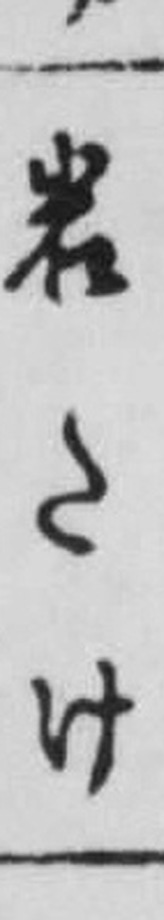岩たけ
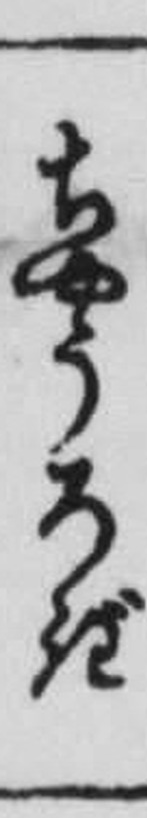ちやうろぎ
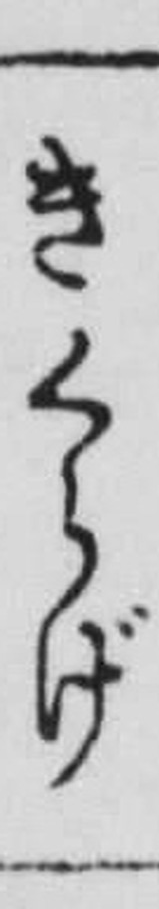きくらげ
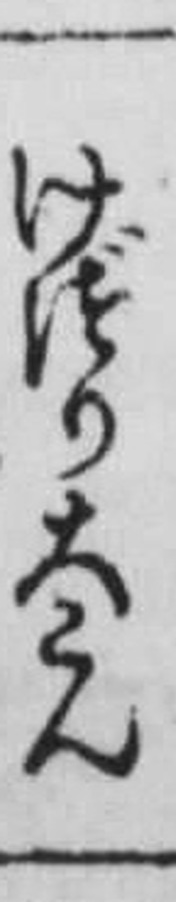けづり大こん
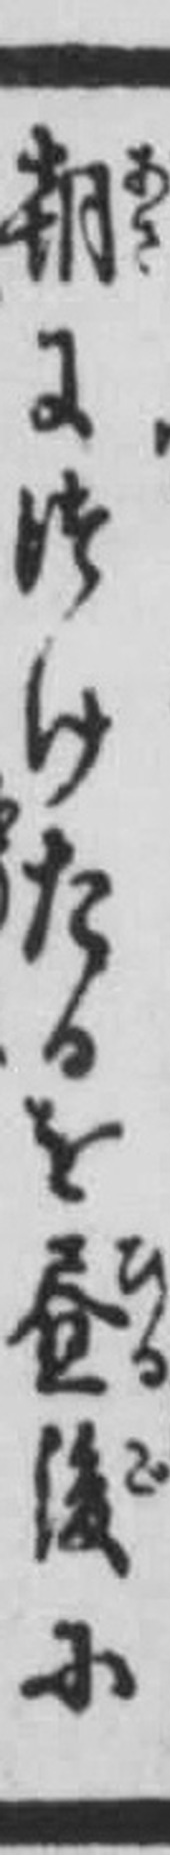朝につけたるを昼後に
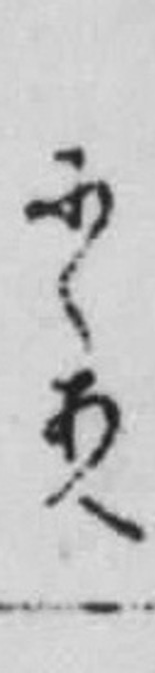にくあへ
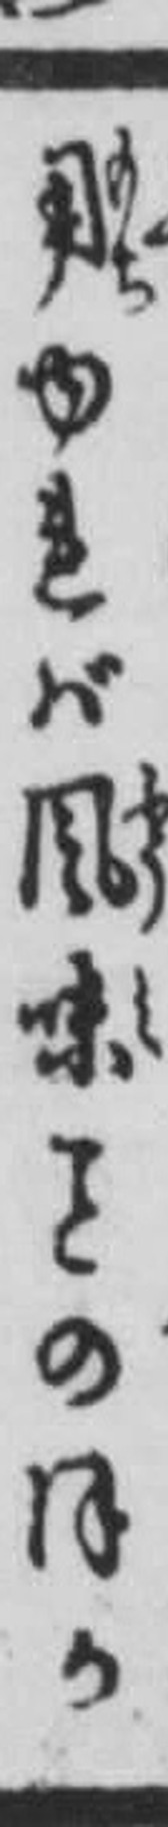用ゆれば風味ことのほか
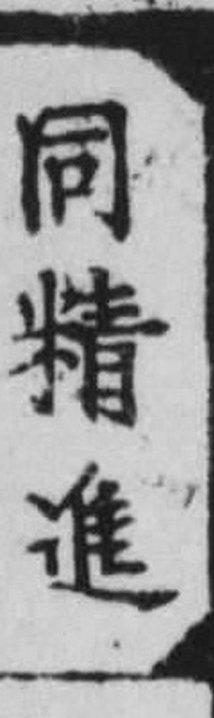同精進
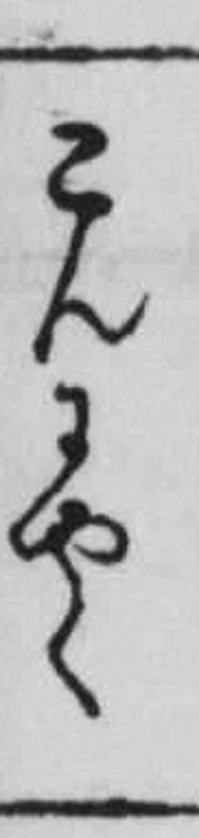こんにやく
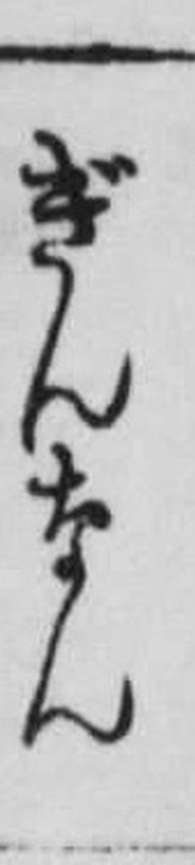ぎんなん
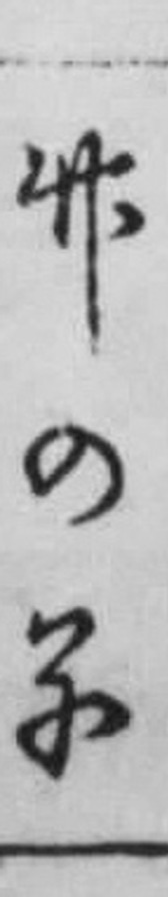竹の子
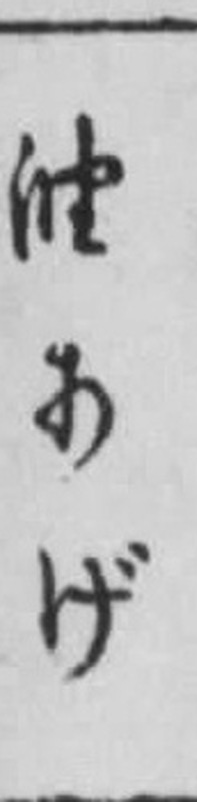油あげ
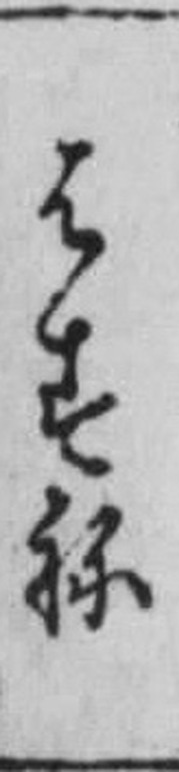はすね
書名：日用重宝魚類精進/料理早工風
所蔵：大阪府立大学学術情報センター 国文学研究資料館
